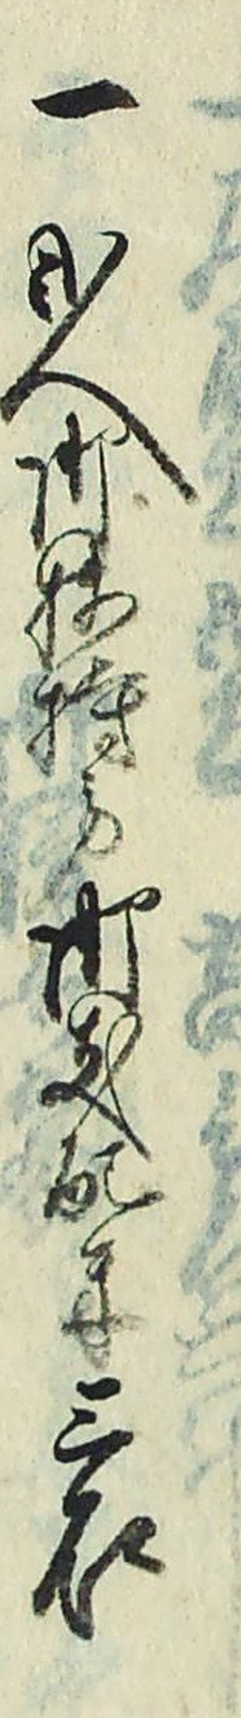一弐人御扶持方御支配米三石
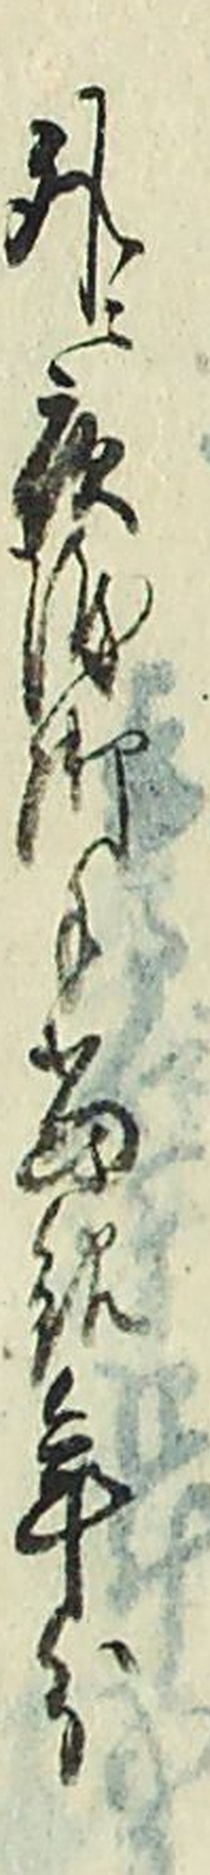外ニ夜渡御手當銀年分
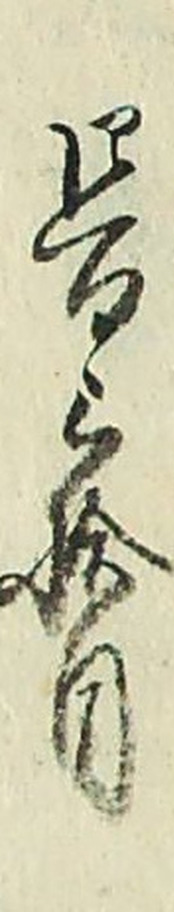四百三拾目
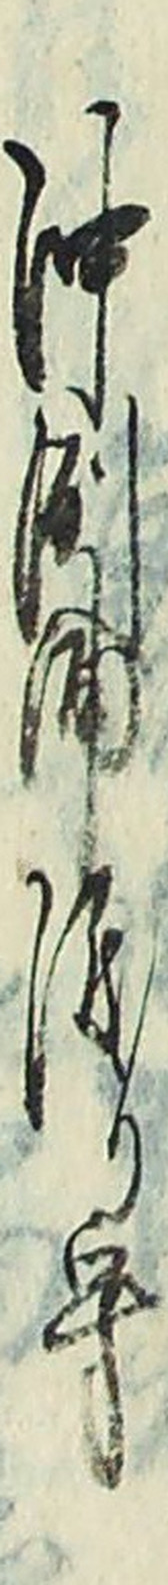沖洲浦渡り守

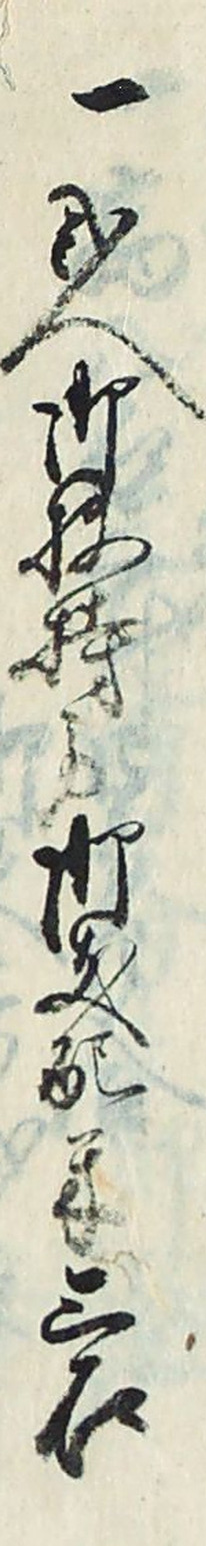一弐人御扶持方御支配米三石
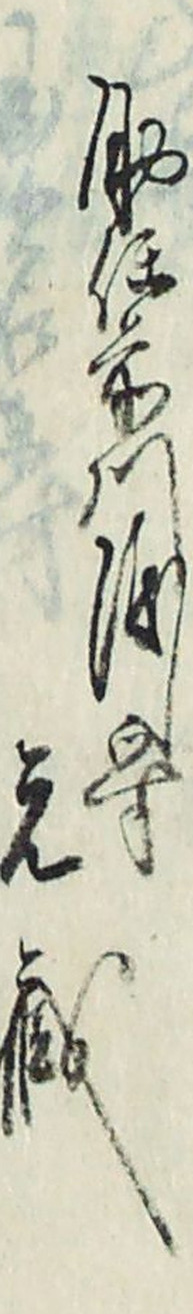助任前川渡し守
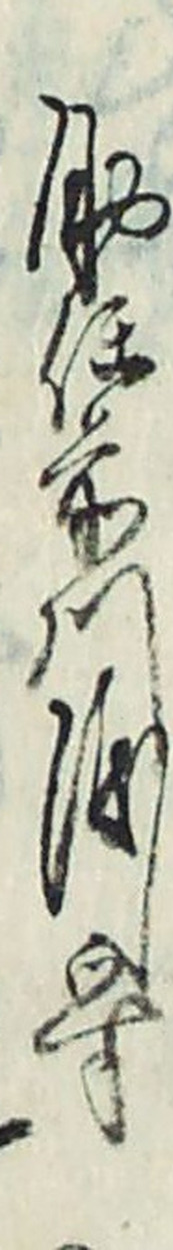助任前川渡し守
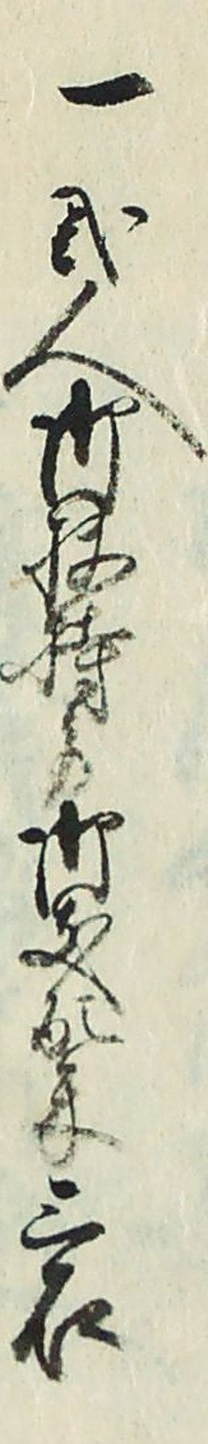一弐人御扶持方御支配米三石
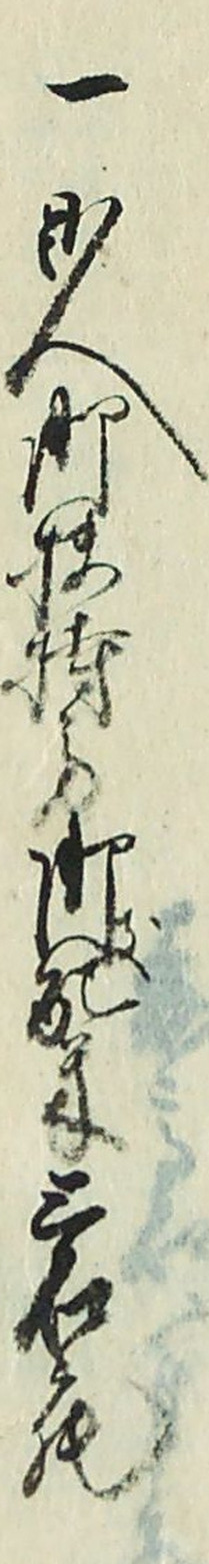一弐人御扶持方御支配米三石宛
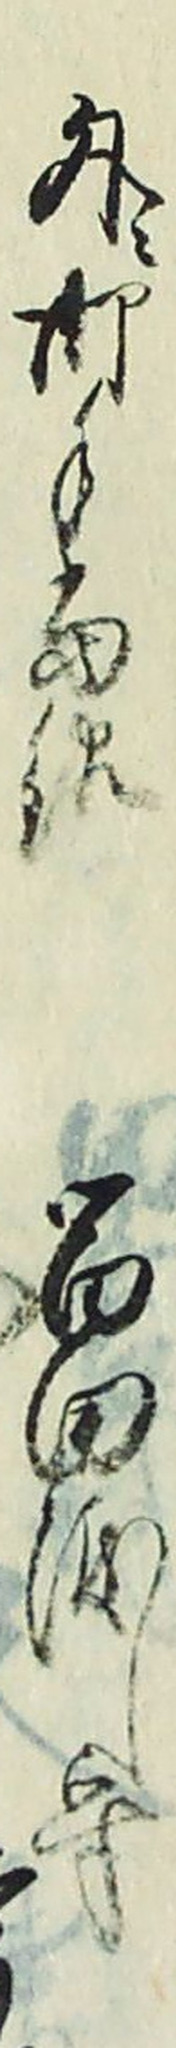外ニ御手當銀冨田渡し守
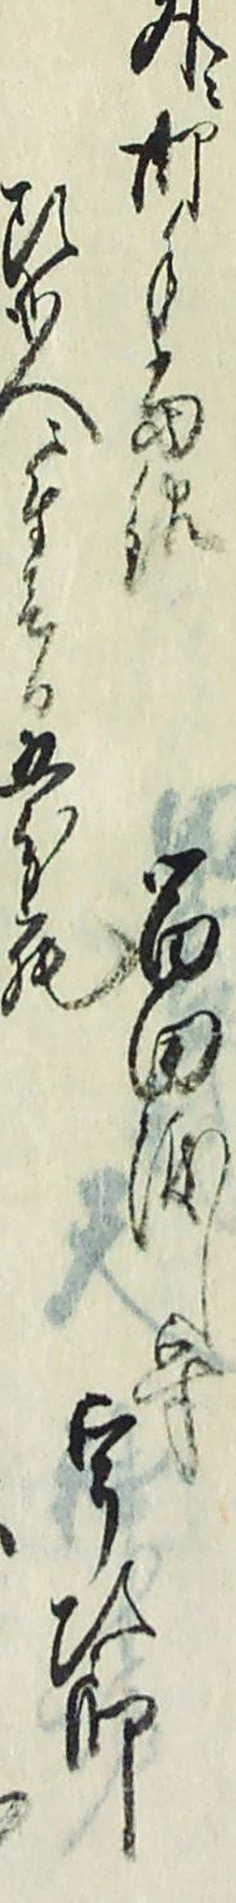頭弐人ニ付壱匁五分宛宇次郎
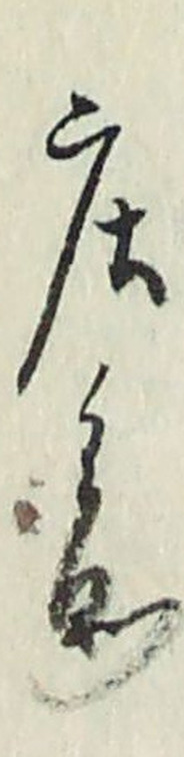庄兵衛
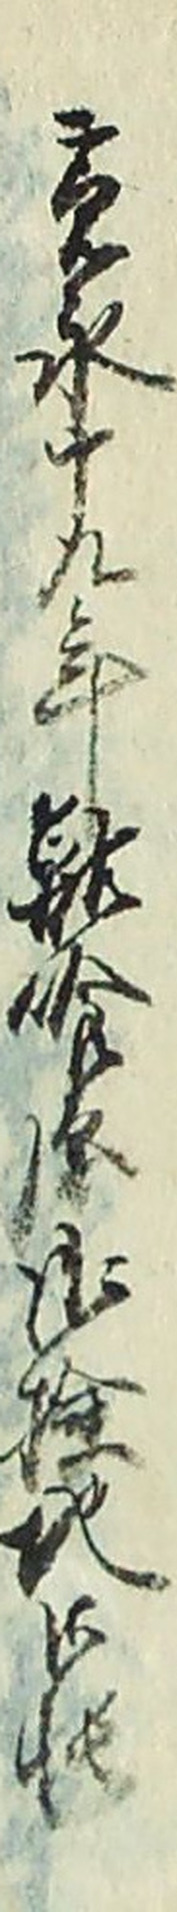寛永十九年鮎喰川御検地御帳
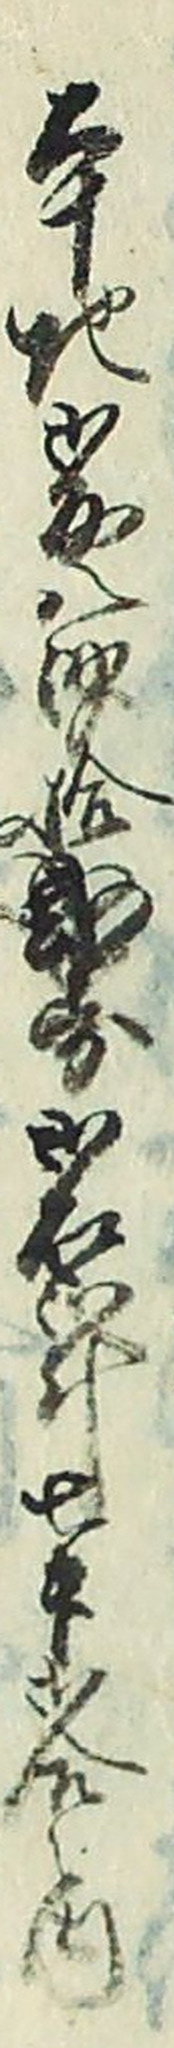本地弐反八畝拾弐歩弐石四斗七升弐合之内
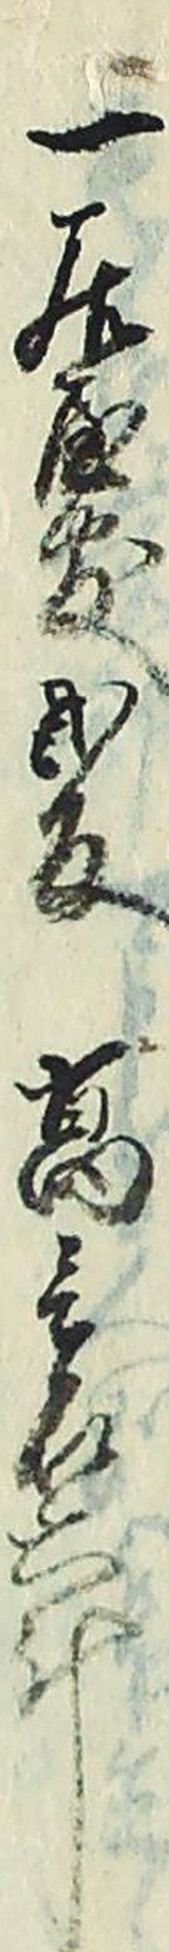一居屋敷弐反高壱石六斗
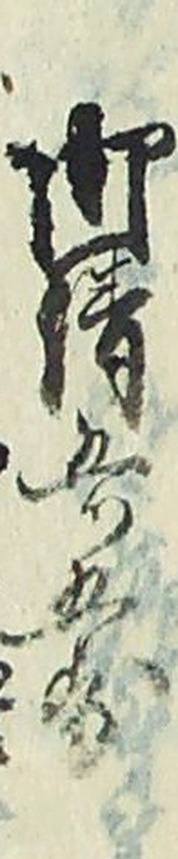御請五ツ五歩
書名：諸御趣意書并御下知向之写
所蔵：鳴門教育大学 Naruto University of Education
